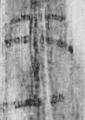王
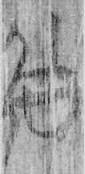居
